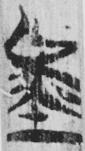○（舜）
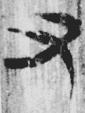又（有）
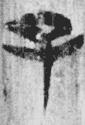子
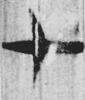七
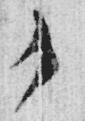人
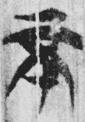不
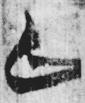㠯（以）
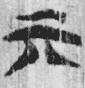亓（其）
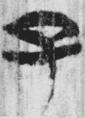子
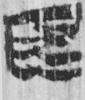爲
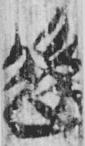後
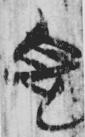見
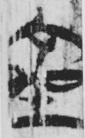○（禹）
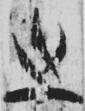之
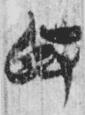臤（賢）
